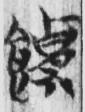饋
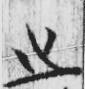之
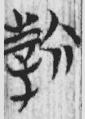新
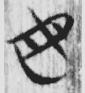母
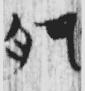肥
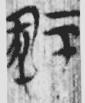冢
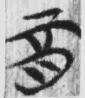酉（酒）
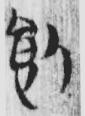○（食）
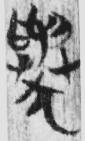○（舉）
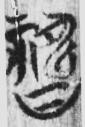禱
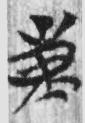東
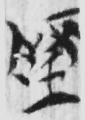陵
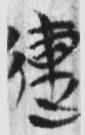連
